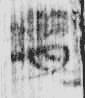亯
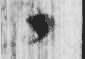丁
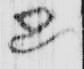巳
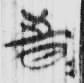之日
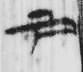下
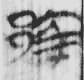○（蔡）
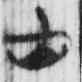山
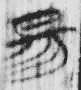昜（陽）
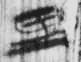里
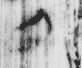人
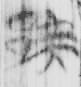邞
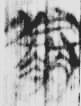○（拳）
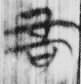言
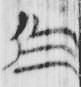於
